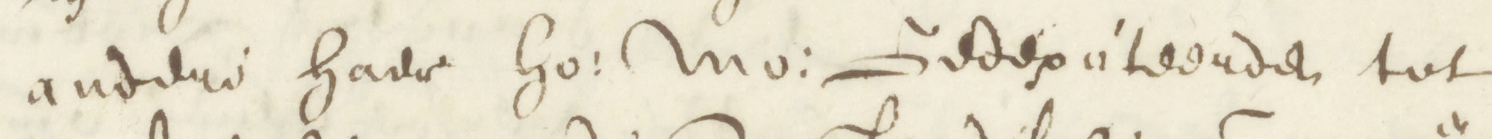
andere haer ho:mo: Gedeputeerden tot
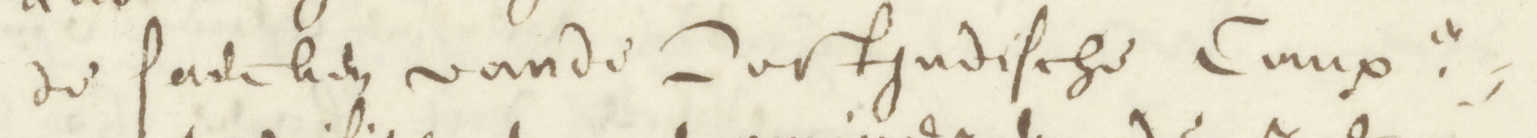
de saecken vande Oostindische Compe.
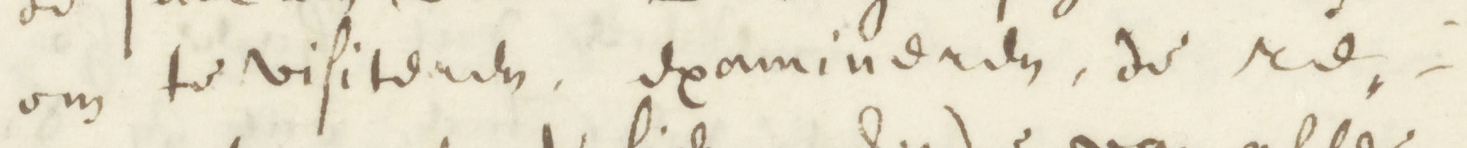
om te visiteren, examineren, de re,,
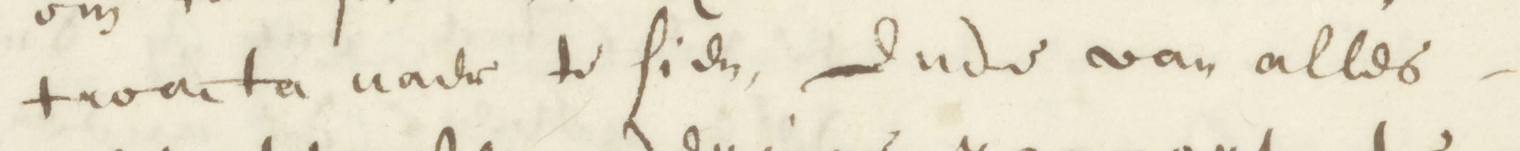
troacta naer te sien, ende van alles
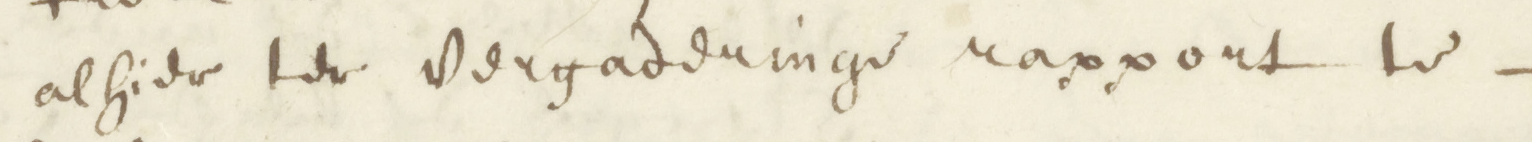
alhier ter vergaderinge rapport te
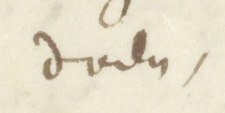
doen.
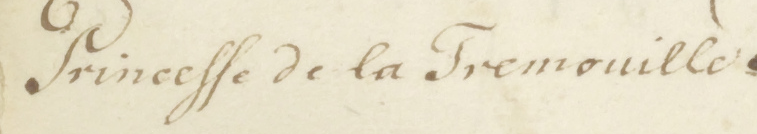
Princesse de la Tremouille
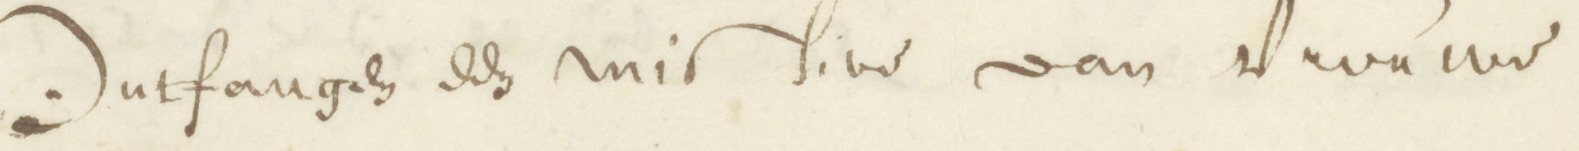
Ontfangen een missive van Vrouwe
